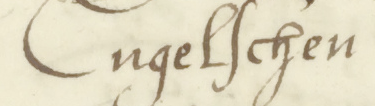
Engelschen
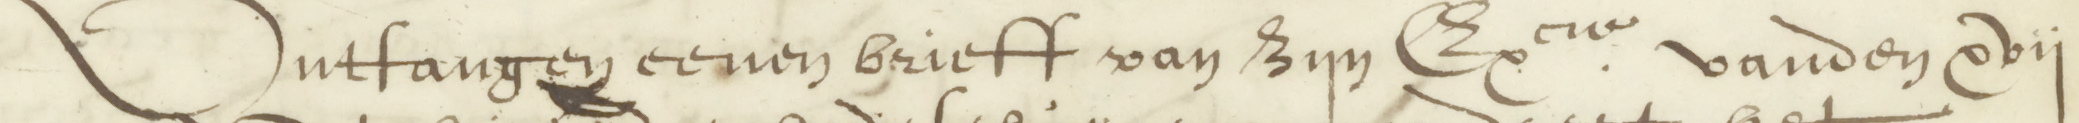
Ontfangen eenen brieff van zyn Excie. vanden xvij
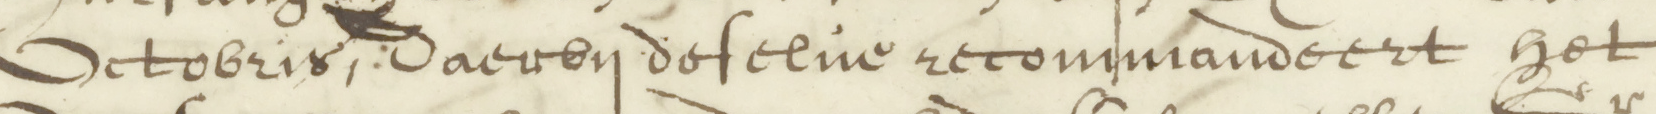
Octobris, daerby deselue recommandeert het
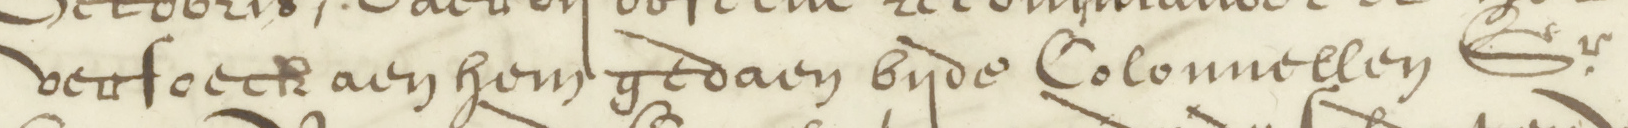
versoeck aen hem gedaen byde Colonnellen Sr
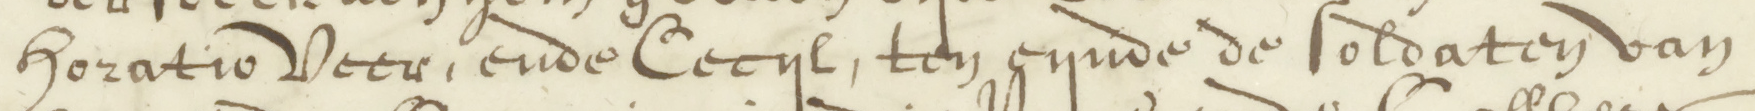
Horatio Veer, ende Cecyl, ten eynde de soldaten van
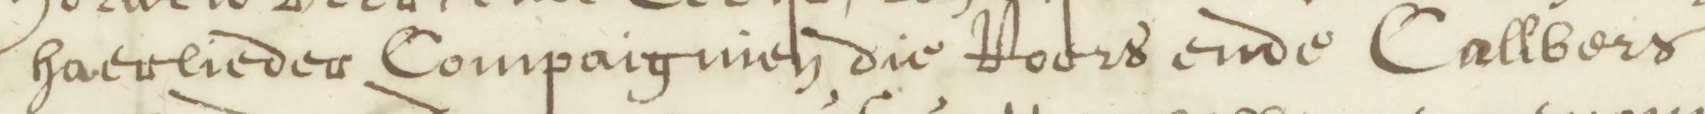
haerlieder Compaignien die Roers ende Callbers
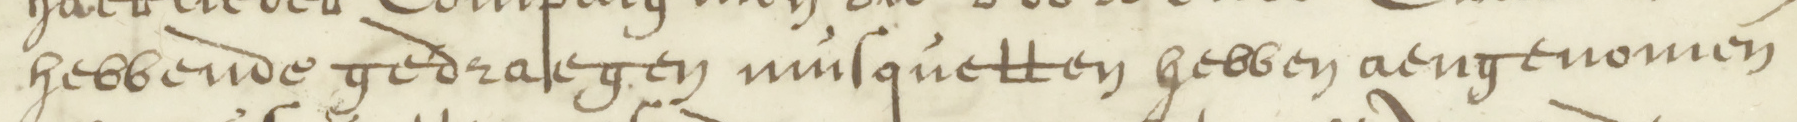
hebbende gedraegen musquetten hebben aengenomen
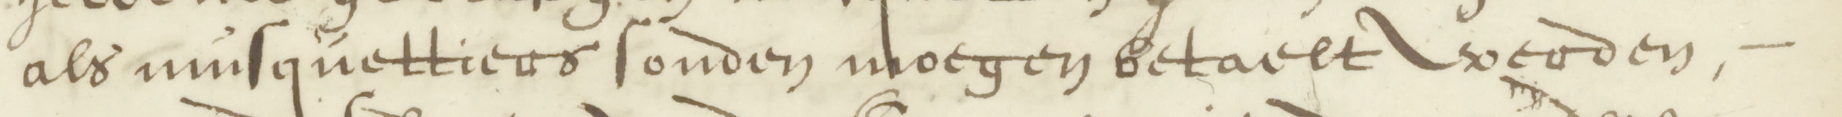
als musquettiers souden moegen betaelt werden, -
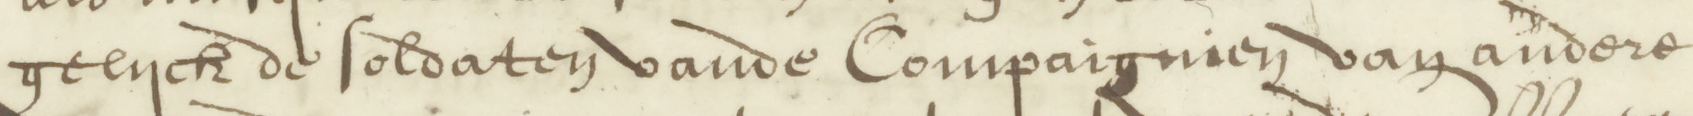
gelyck de soldaten vande Compaignien van andere
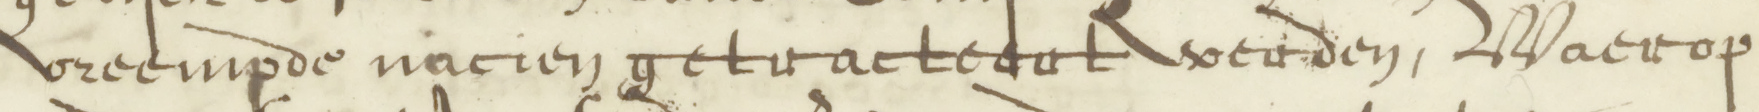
vreempde nacien getracteert werden. Waerop
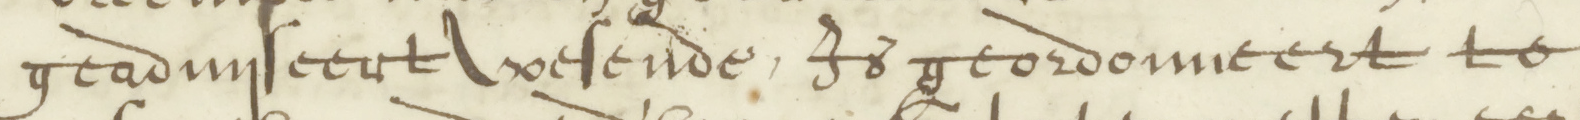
geaduyseert wesende, Is geordonneert te
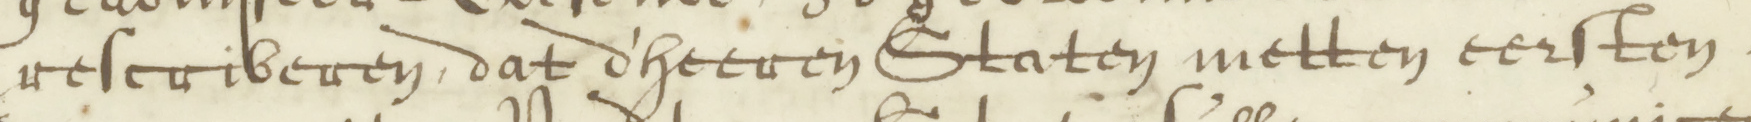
rescriberen, dat d'heeren Staten metten eersten
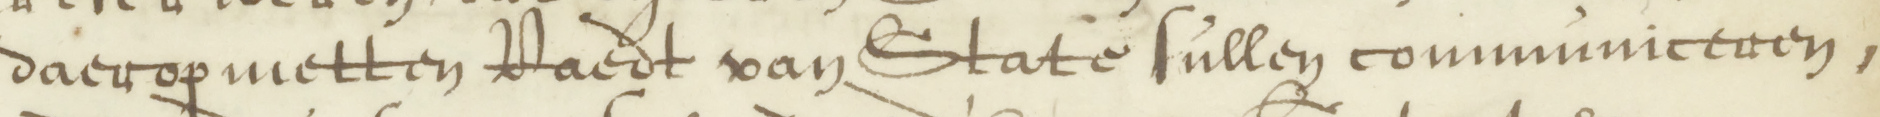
daerop metten Raedt van State sullen communiceren,
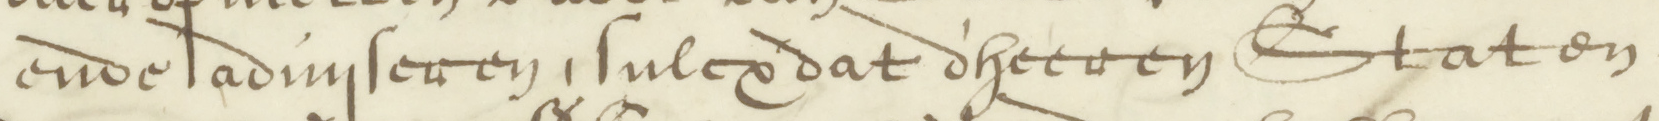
ende aduyseren, sulcx dat d'heeren Staten
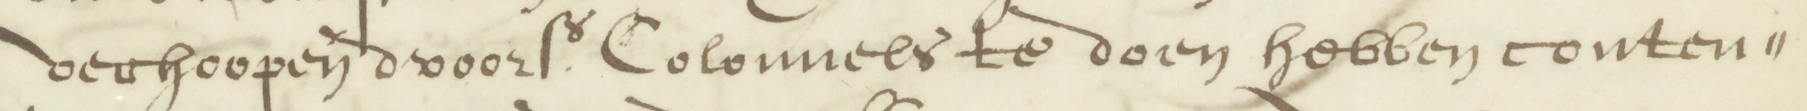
verhoopen dvoors. Colonnels te doen hebben conten„
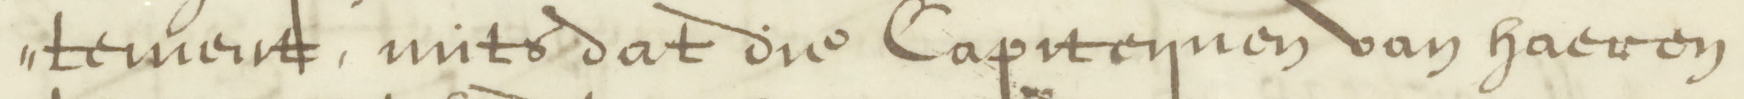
,,tement, mits dat die Capiteynen van haeren
